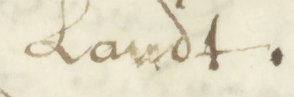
Landt.
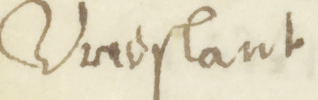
Vrieslant
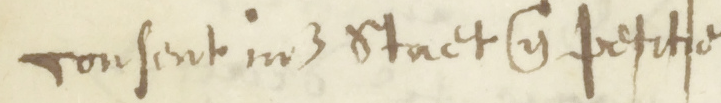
consent in Staet en Petitie
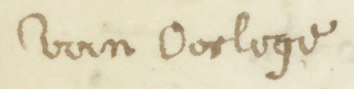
van Oorloge
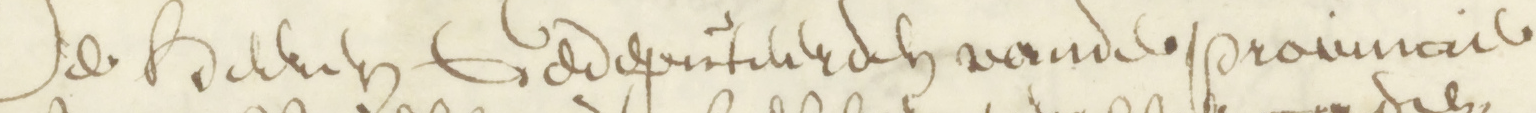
De Heeren Gedeputeerden vande provincie
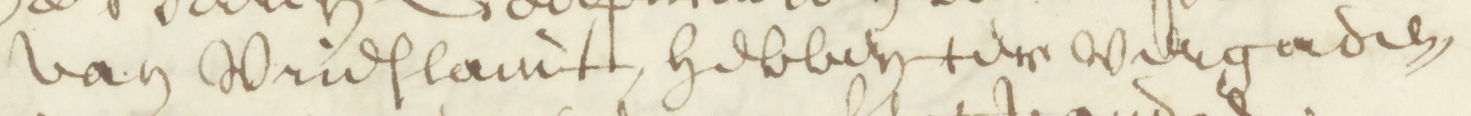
van Vrieslant, hebben ter Vergade„
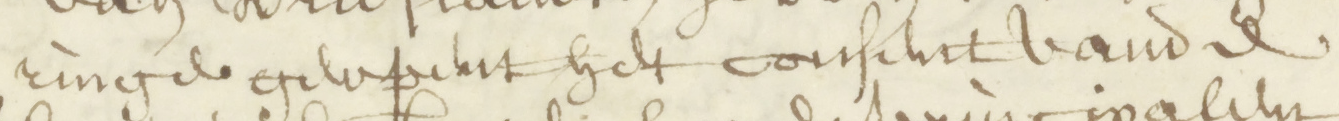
ringe geopent het consent vande
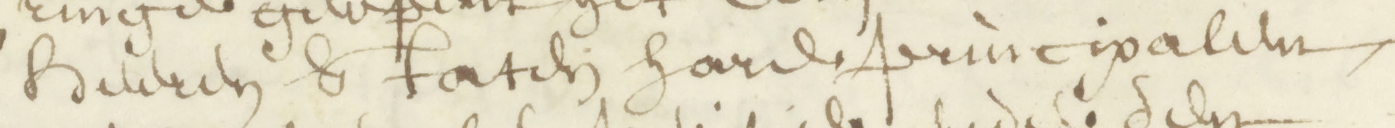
Heeren Staten hare principalen
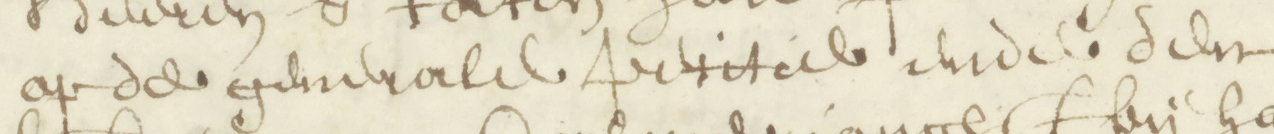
op de generale Petitie ende den
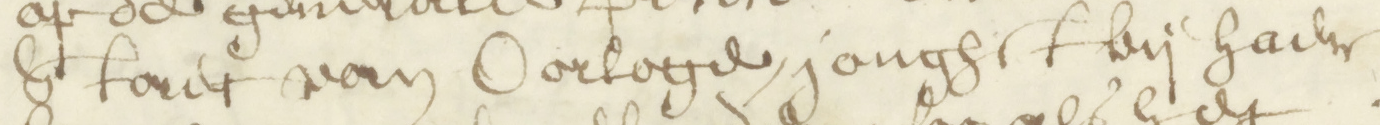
Staet vanOorloge, jonghst bij haer
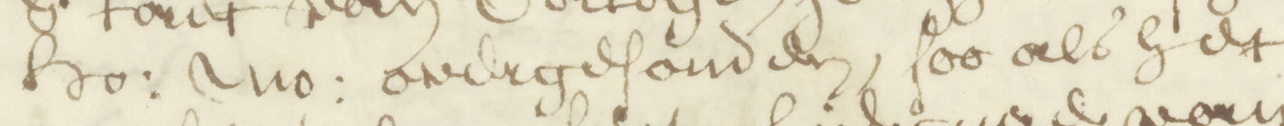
Ho:Mo: overgesonden, soo als het
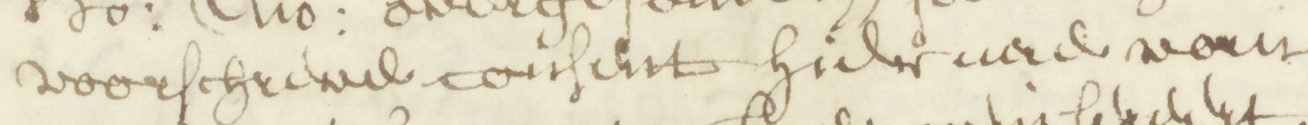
voorschreve consent hiernae van
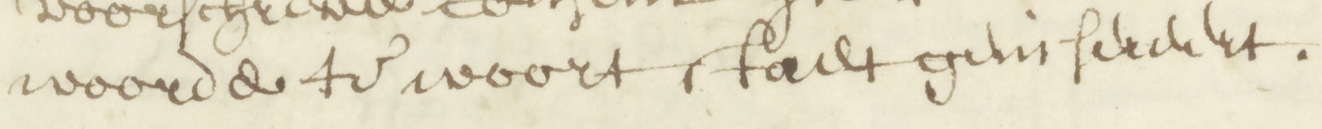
woorde te woort staet geinsereert.
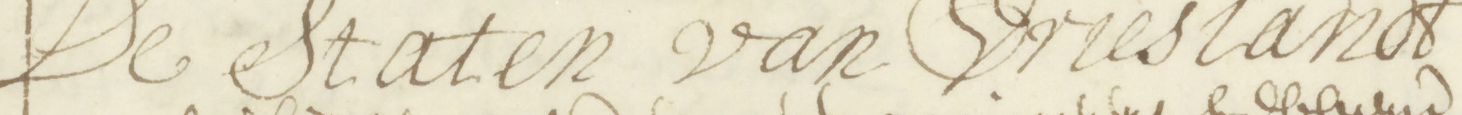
De Staten van Vrieslandt
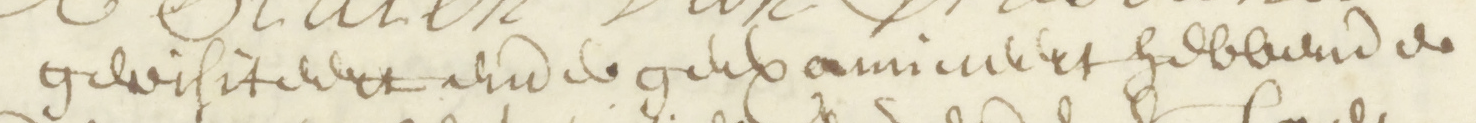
gevisiteert ende geexamineert hebbende
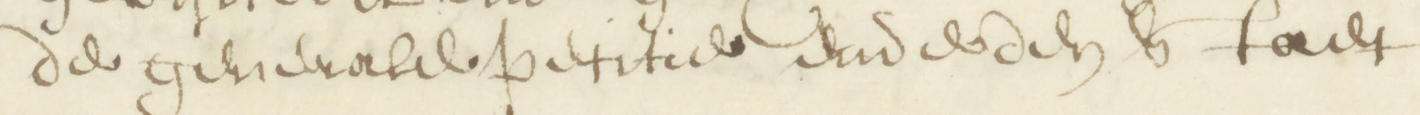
de generale Petitie ende den Staet
